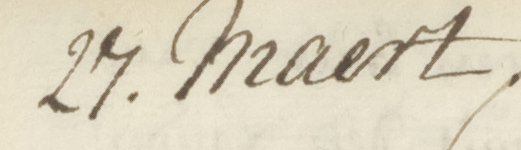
27. Maert
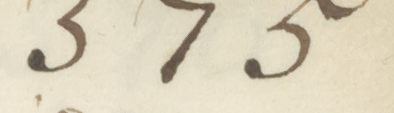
375
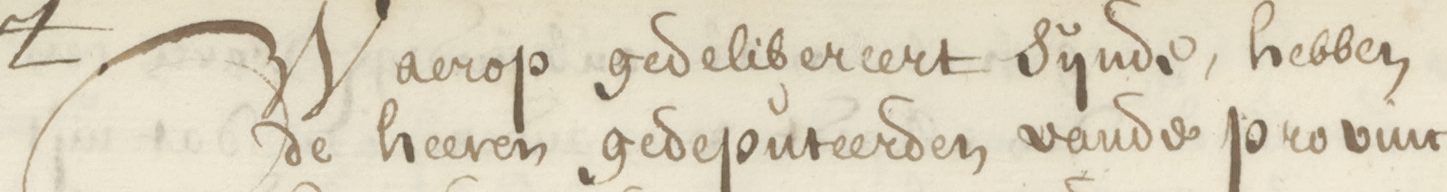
Waerop gedelibereert sijnde, hebben
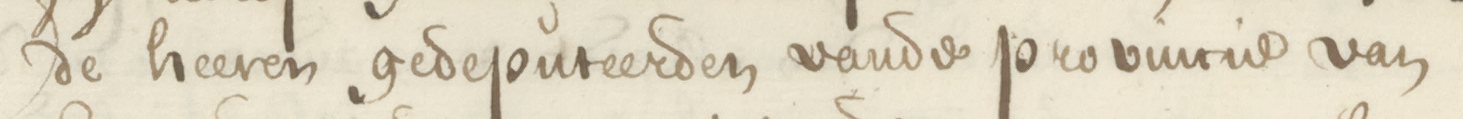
de heeren gedeputeerden vande provincie van
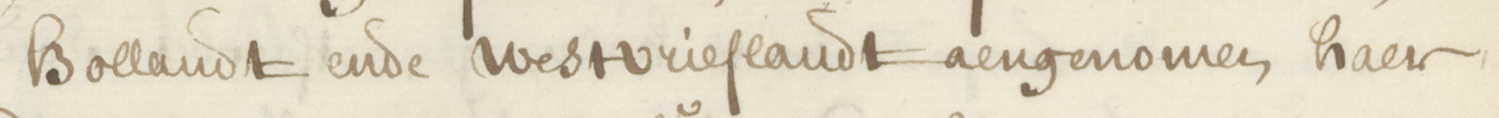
Hollandt, ende Westvrieslandt aengenomen haer
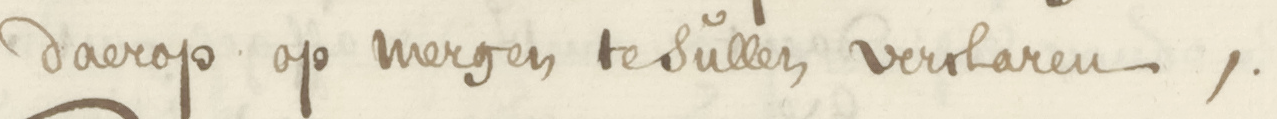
daerop op mergen te sullen verclaren.
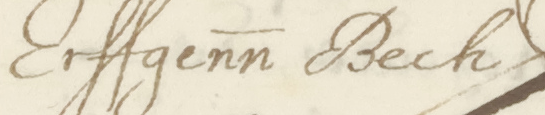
Erffgenn Beck ca.
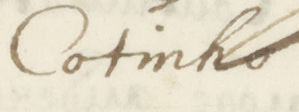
Cotinho
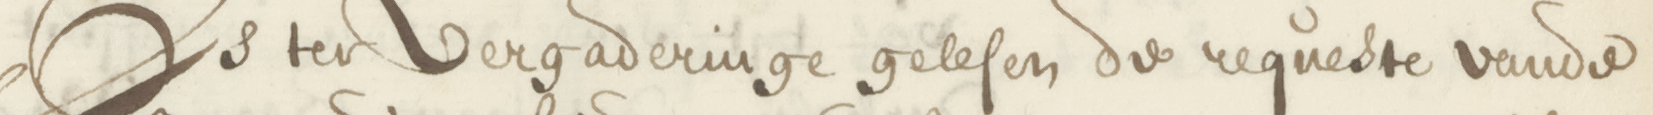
Is ter Vergaderinge gelesen de requeste vande
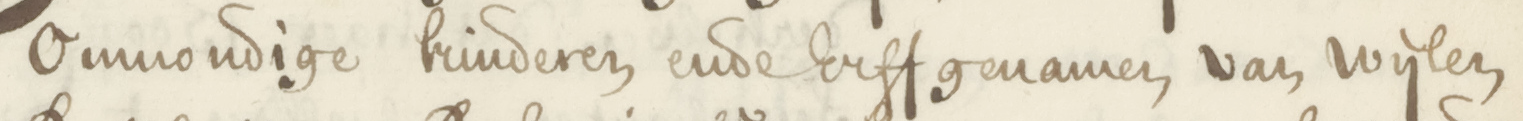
Onmondige kinderen ende Erffgenamen van wijlen
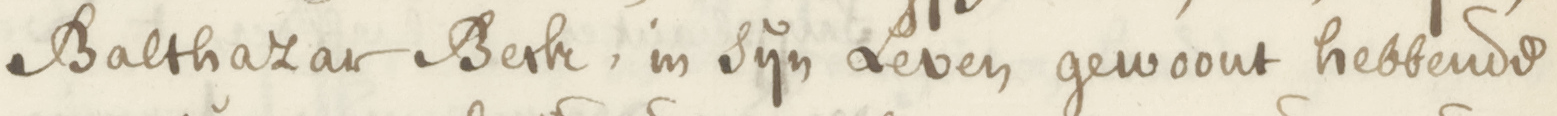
Balthazar Beck, in sijn Leven gewoont hebbende
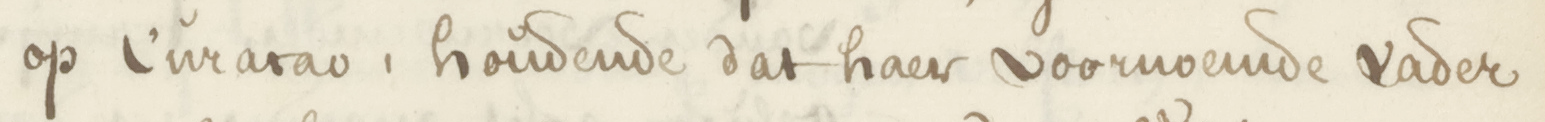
op Curacao, houdende dat haer voornoemde vader
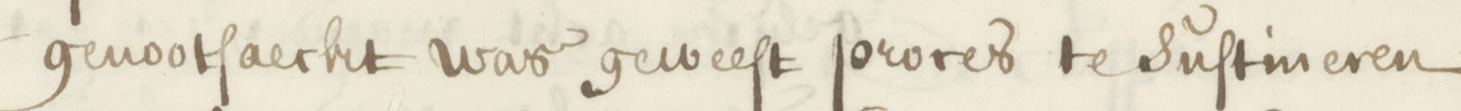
genootsaeckt was geweest proces te sustineren
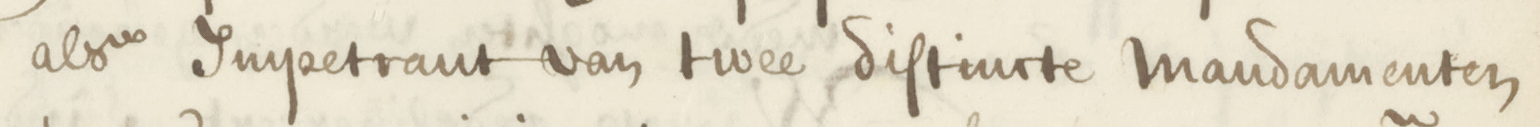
als Impetrant van twee distincte Mandamenten
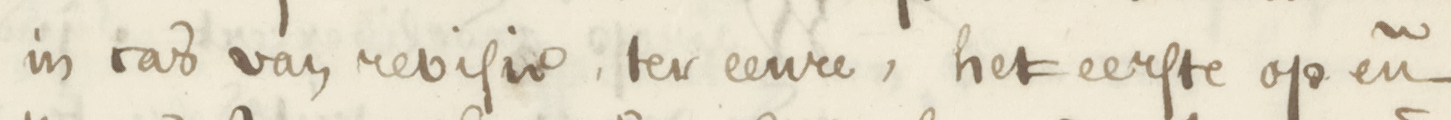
in cas van revisie, ter eenre, het eerste op en
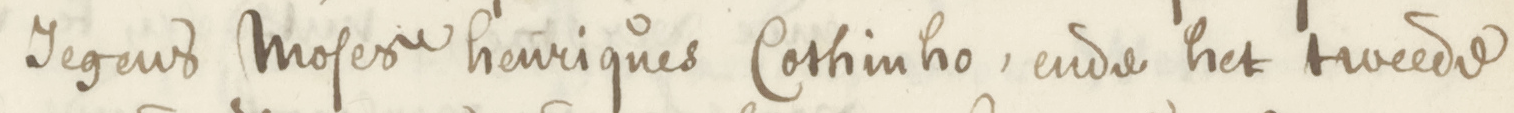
Jegens Moses henriques Cothinho, ende het tweede
